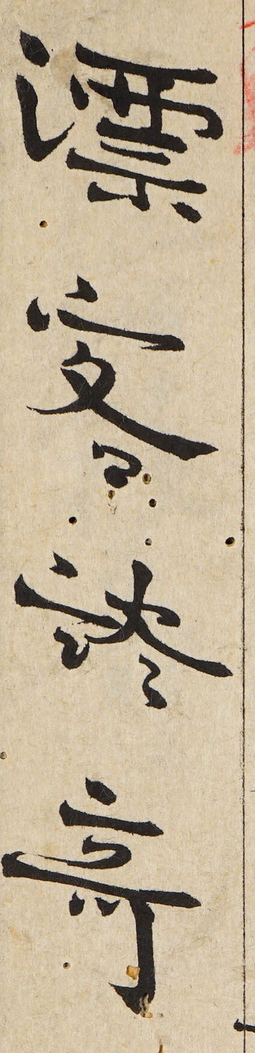漂客談奇

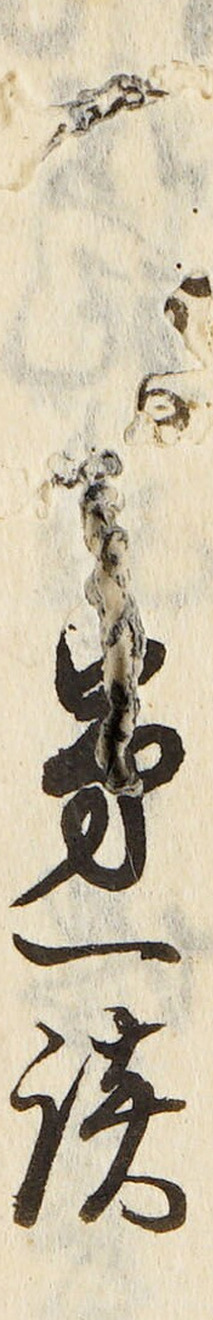第一談
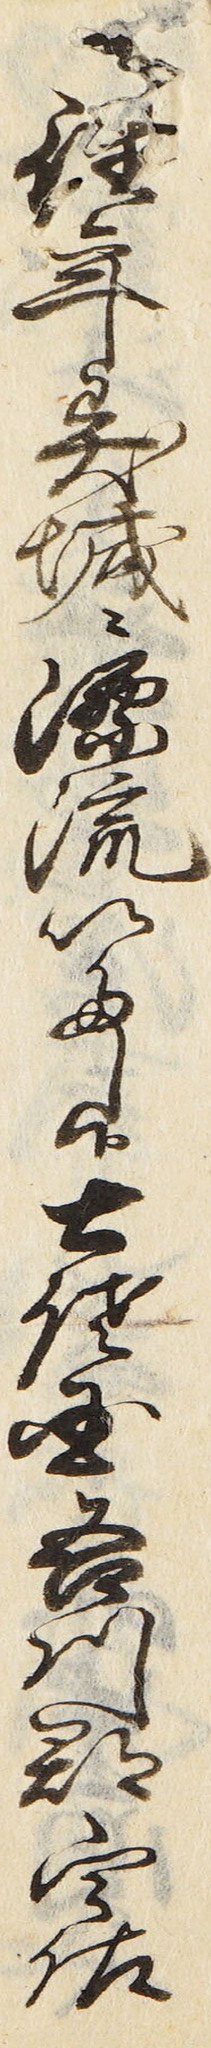往年異域ニ漂流いたし候土佐国吾川郡宇佐
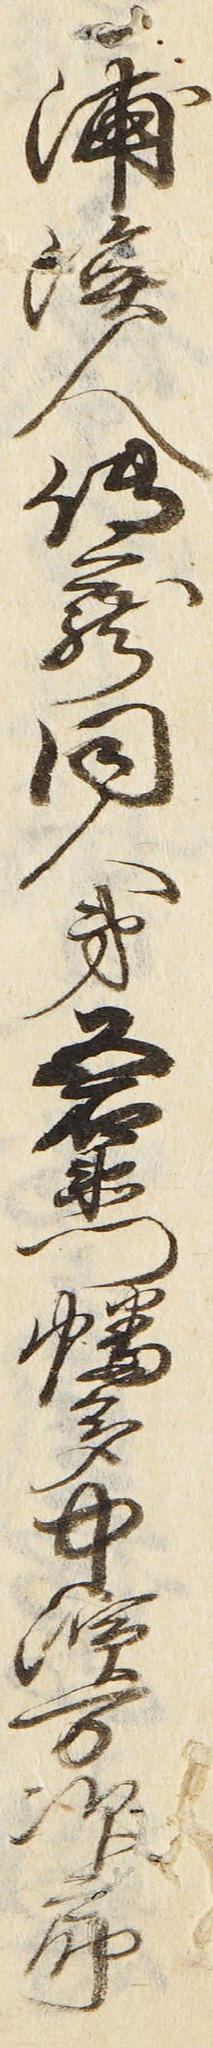浦漁人傳蔵同人弟五石衛門幡多中濱万次郎
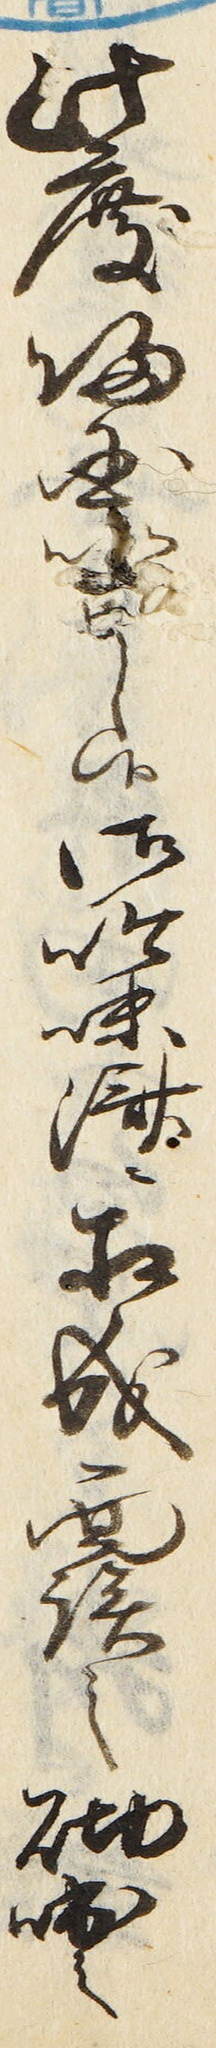此度帰国いたし候御吟味済ニ相成面談之砌咄之
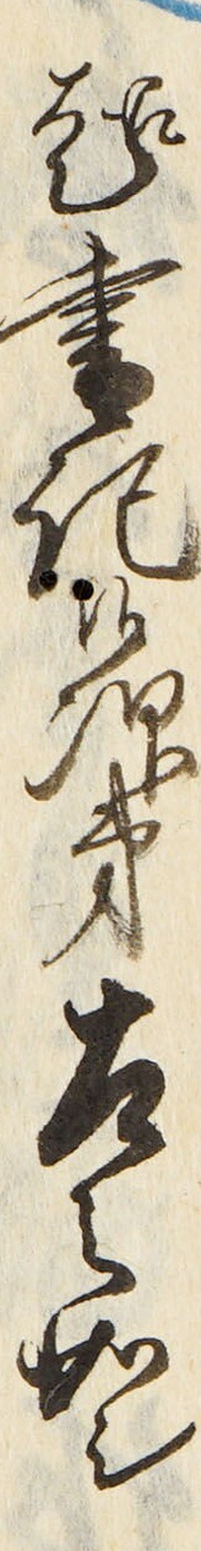趣書記候次第左之如シ
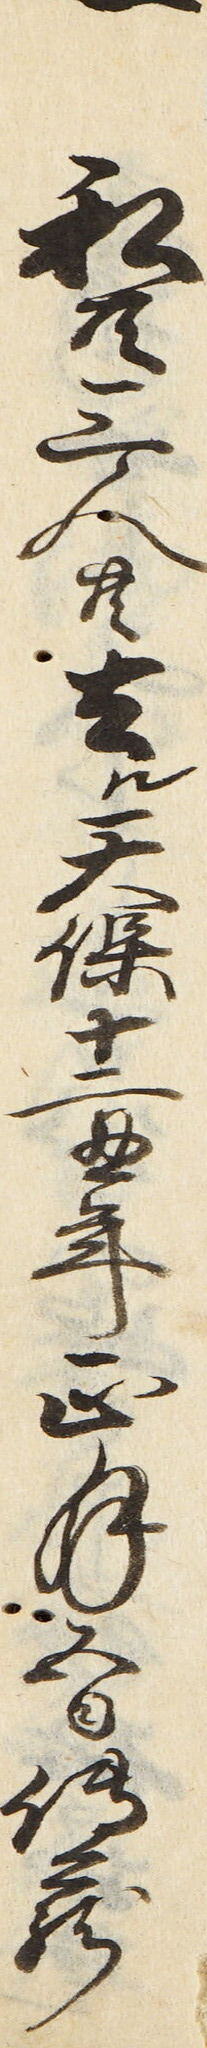一私共三人共去ル天保十二丑年正月五日傳蔵
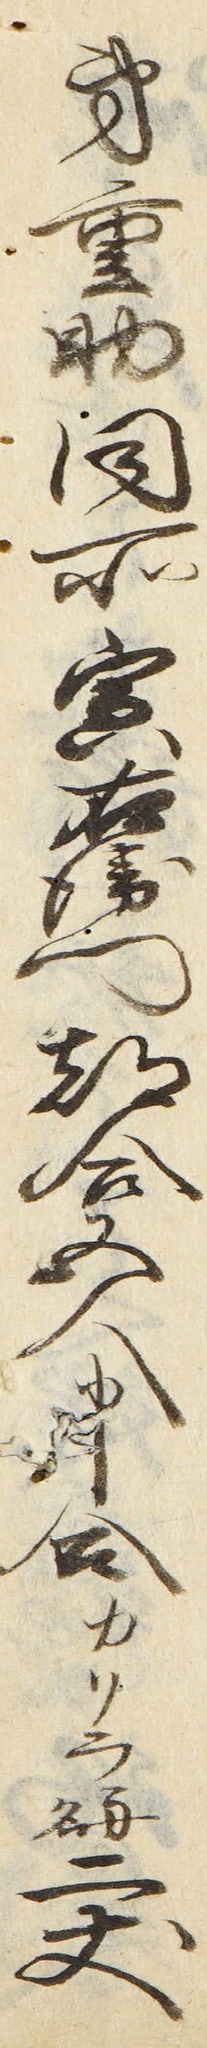弟重助同所寅右衛門都合五人申合カリラ舟名二丈
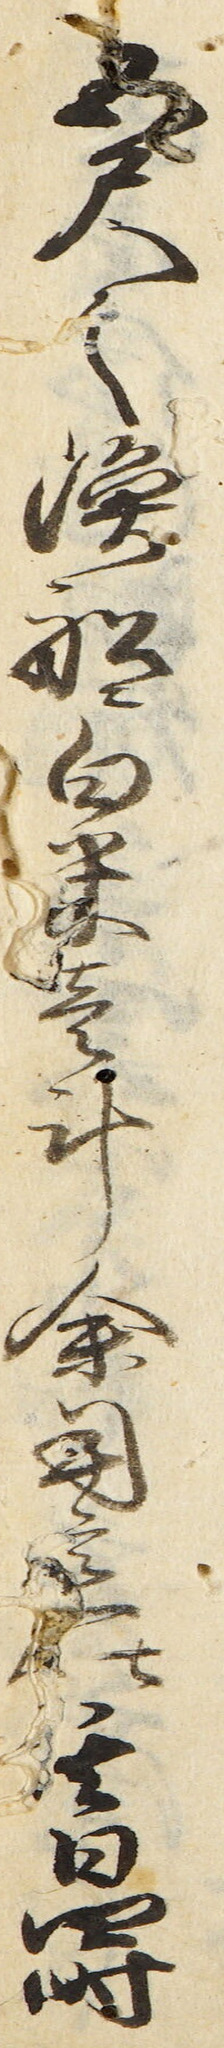五尺之漁舩ニ白米壱斗余用意仕其日四時

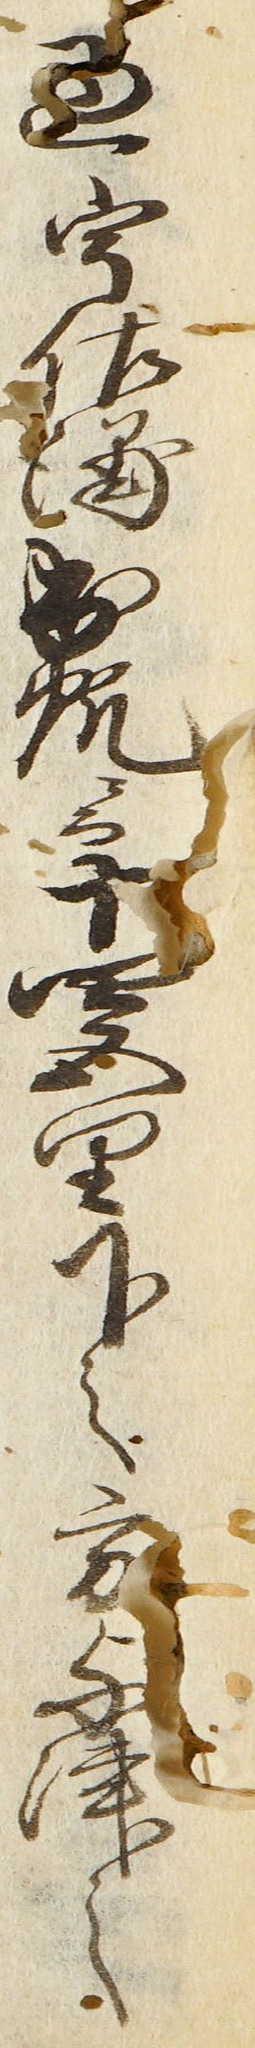過宇佐浦出帆ニ而十四五里下之方与津之
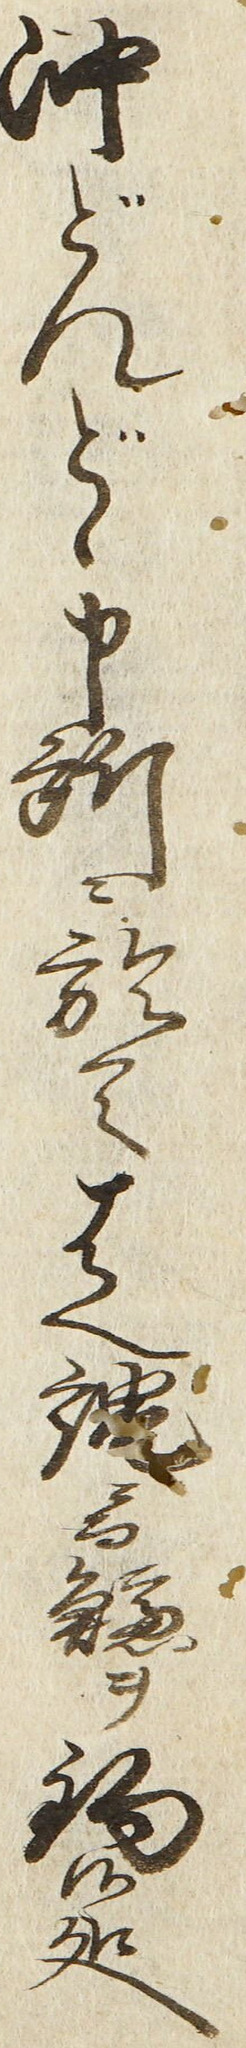沖どんどゝ申所ニ於てはへ縄ニ而鱸ヲ釣候処
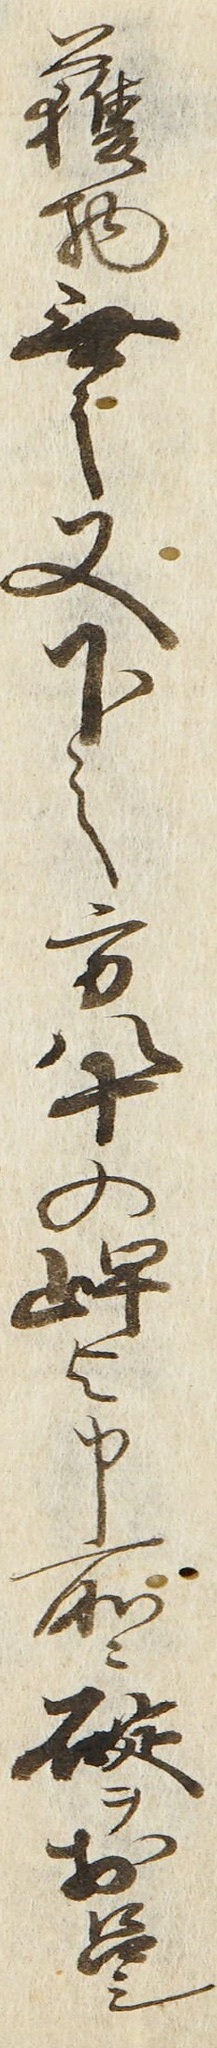獲物無之又下之方八十の岬と申所ニ碇ヲおろシ
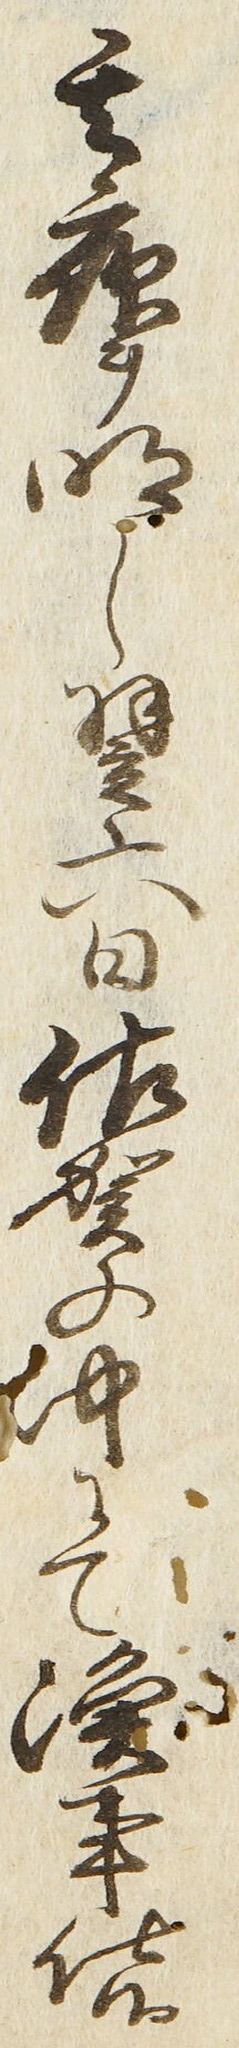其夜ヲ明し翌六日佐賀の沖にて漁事仕候
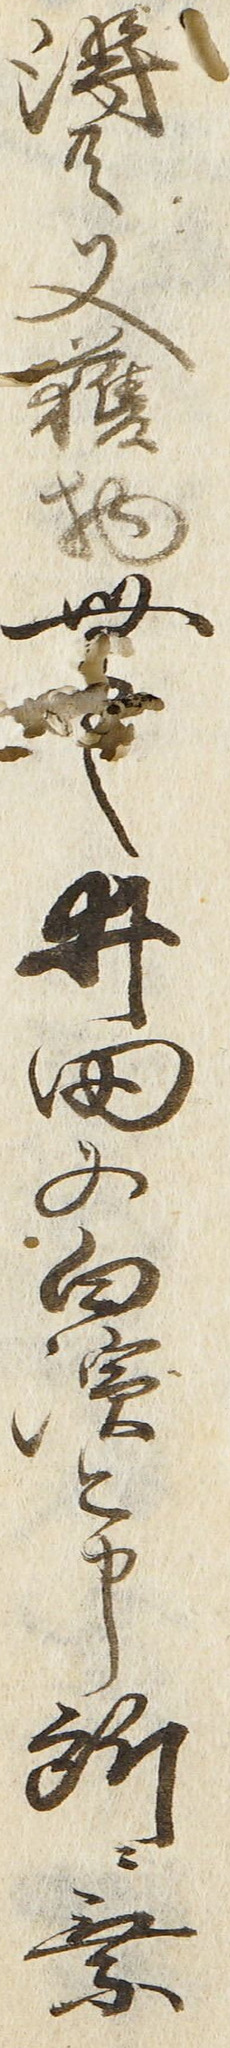得共又獲物無之井田の白濱と申所ニ乗
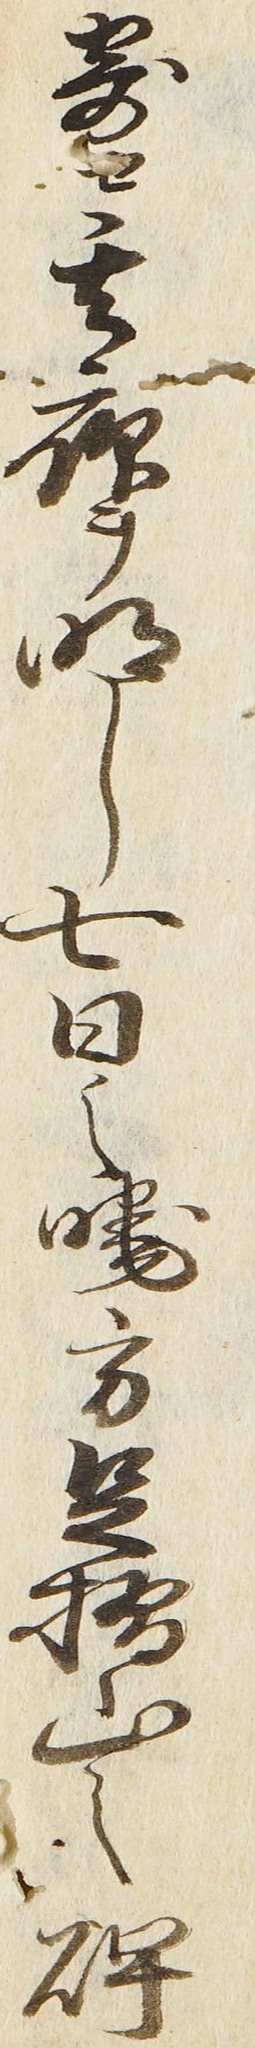寄セ其夜ヲ明し七日之暁方足摺山之岬
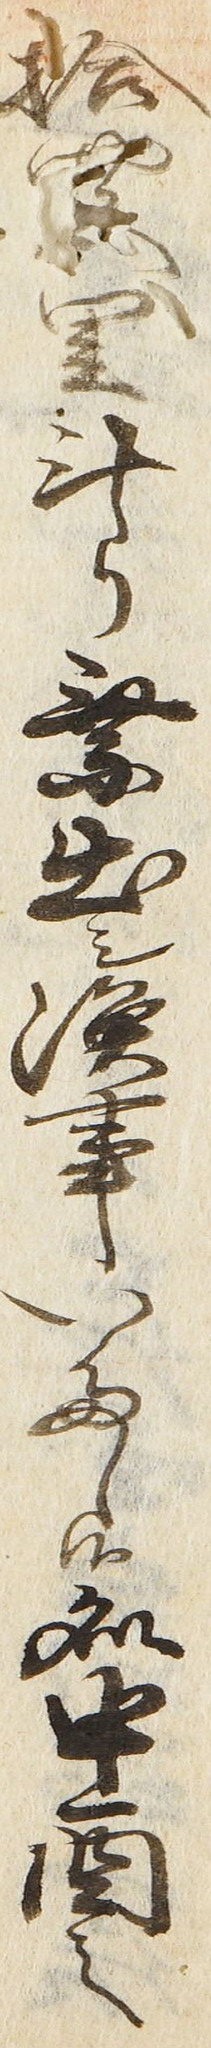拾四五里斗り乗出シ漁事いたし候処申酉之
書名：漂客談寄
